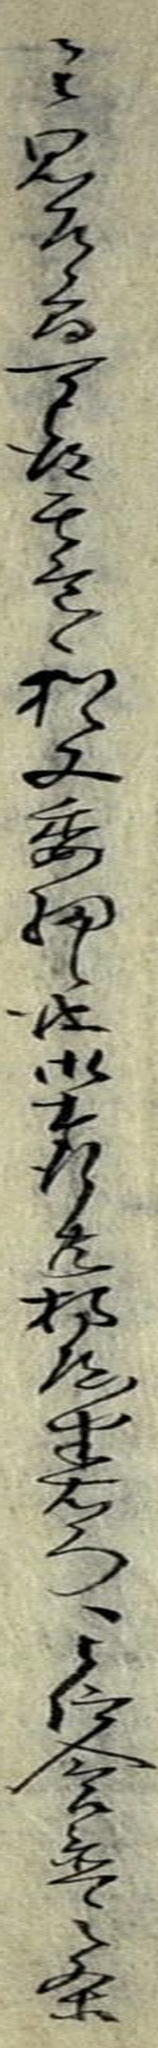ニ被思召候間可被得其意候猶又委細之儀御奉行共栃屋半右衛門へ被仰含置候条
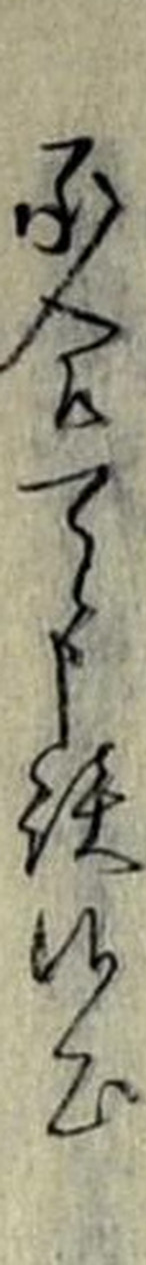承合可被申段候以上
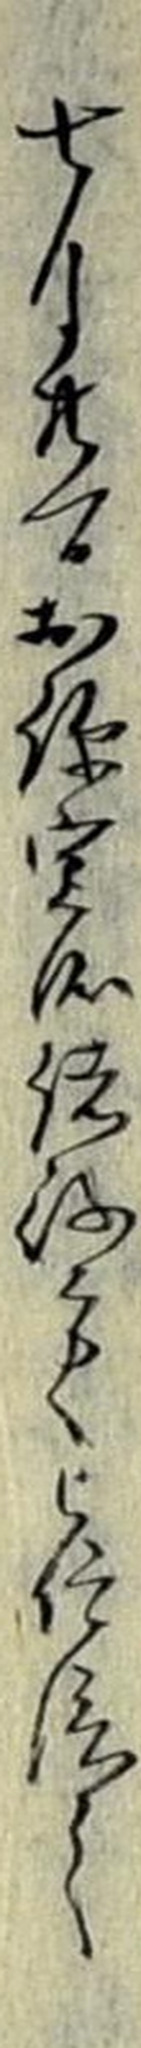七月廿一日於評定所諸役方へ被仰渡之
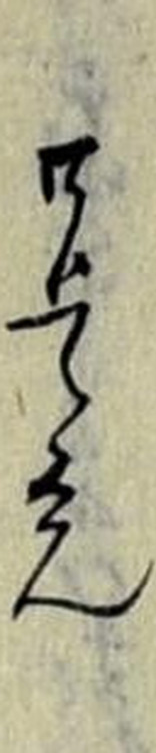口上之覚
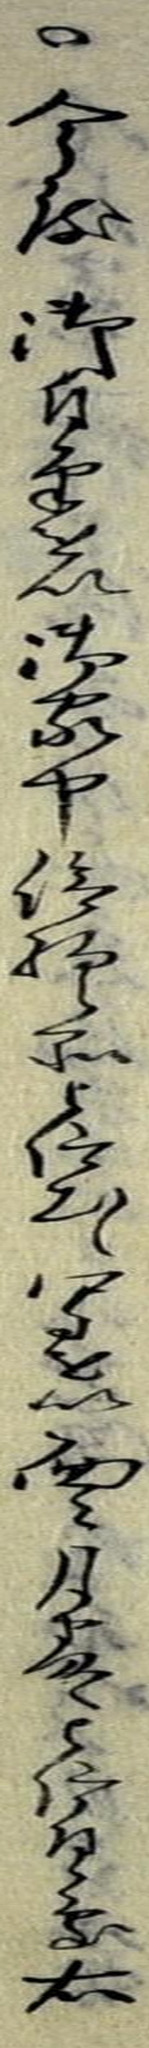〇今度御自筆を以御家中倹約之品被仰出候写を以面々月番へ被仰付候処右
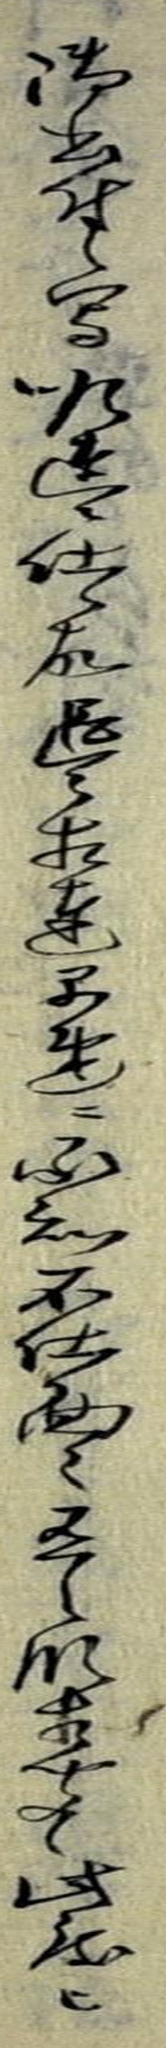御書付之写順達ニ仕候故追々相達早速ニ承知不仕面々有之段相聞候此度被
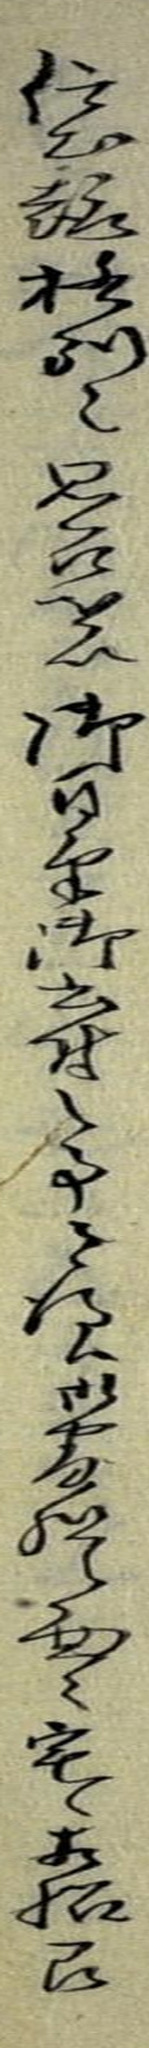仰出趣格別之思召を以御自筆御書付之事ニ候得ハ御番組之面々宅へ相招即
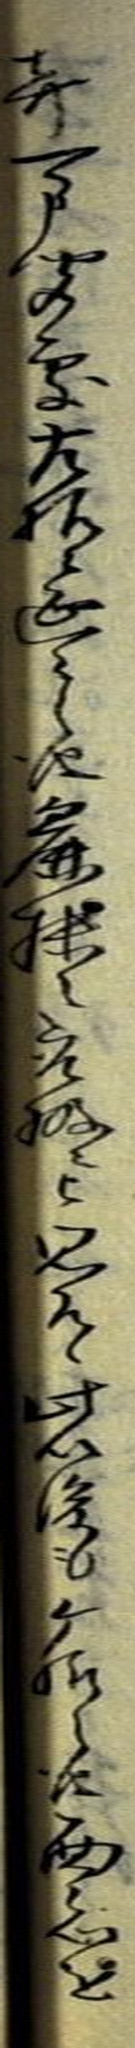刻可申聞処左様ニ延々之儀麁抹之取扱ニ被思召候此以後もケ様之儀面々心を
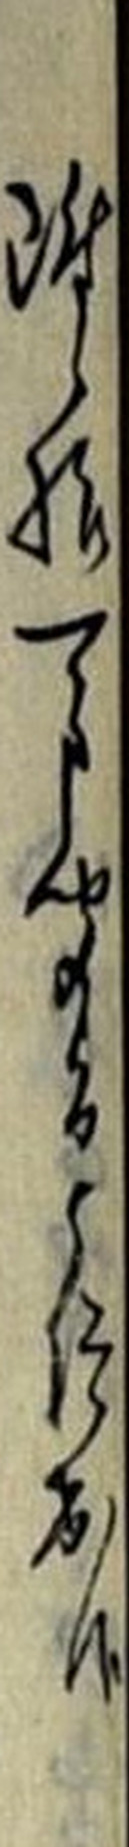付候様可申聞旨被仰出候
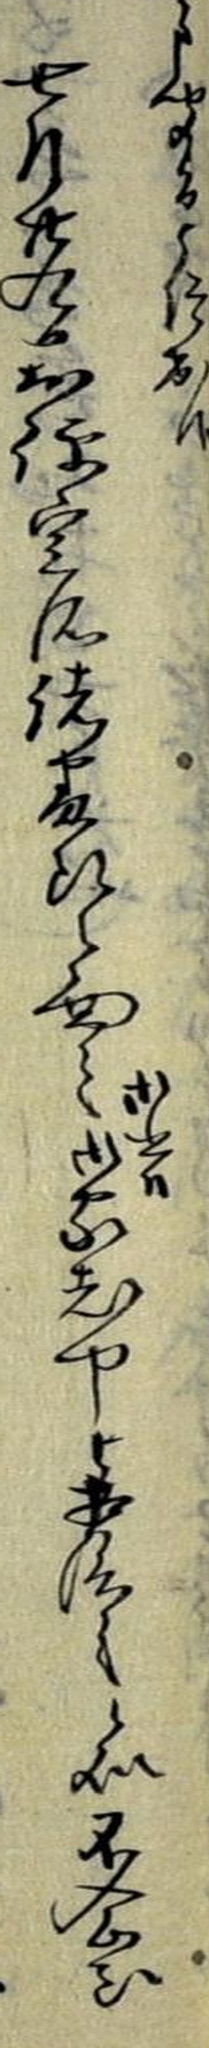七月廿九日於評定所諸番頭之面々へ御書付御家老中被相渡之候処不念至
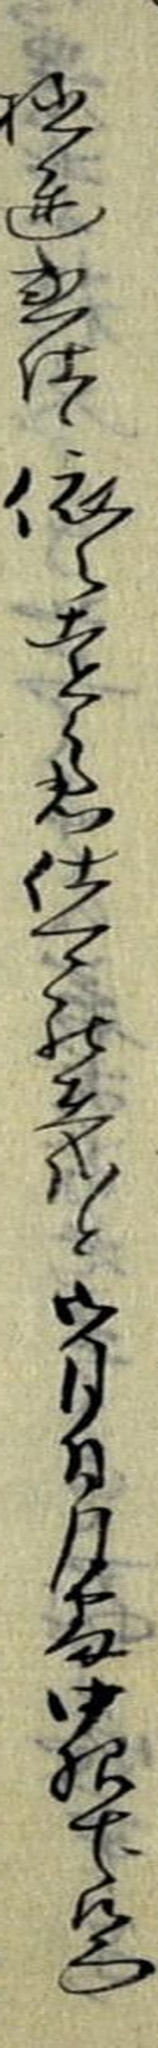極迷惑仕候依之遠慮仕可罷在哉と御目付月番中根十郎左衛門
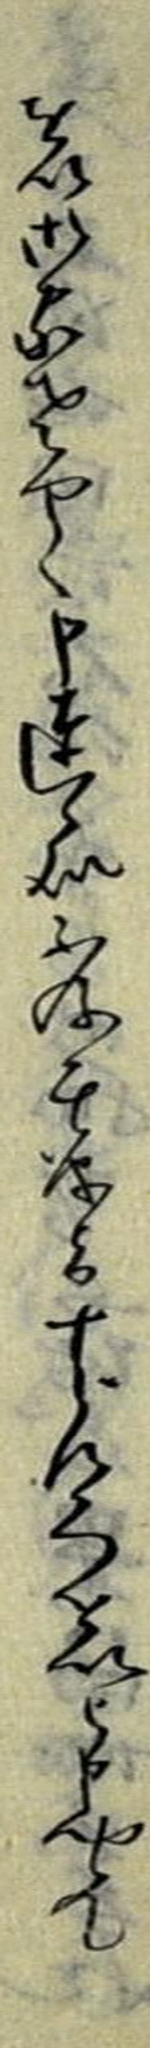を以御家老中へ申達候処不及其儀旨十郎左衛門を以被申聞候
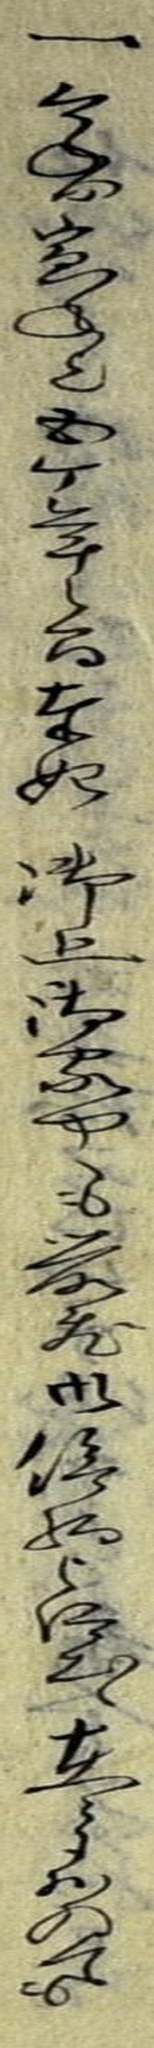一今年ゟ寅年迄五ケ年之間奉始御上御家中へも厳敷御倹約被仰出候在々ニおゐても
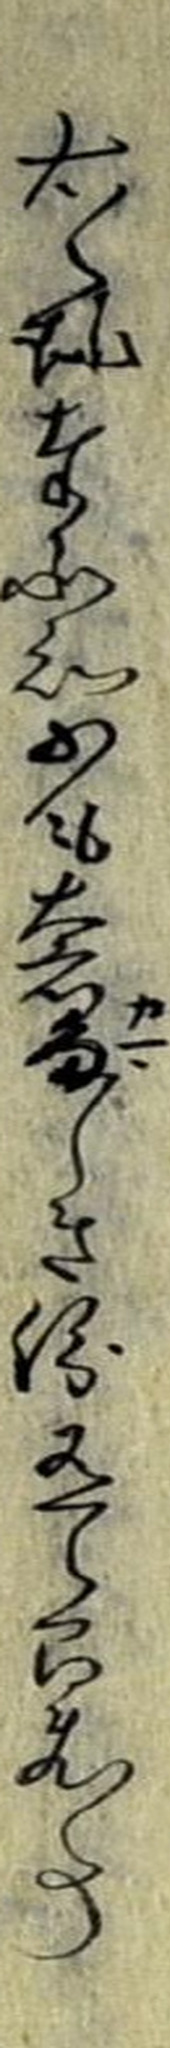右之趣奉承知少も奢ましき儀有之間敷事
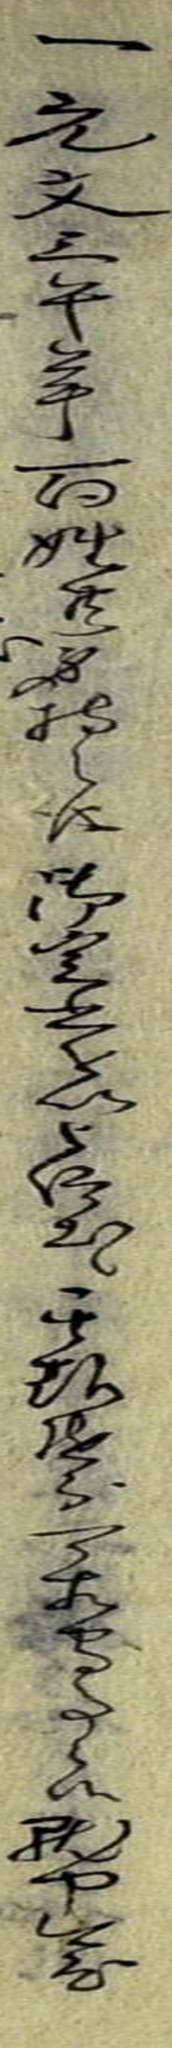一元文三午年百姓共身持之儀御定書を以被仰出候其趣随分可相守事ニ候就中今度
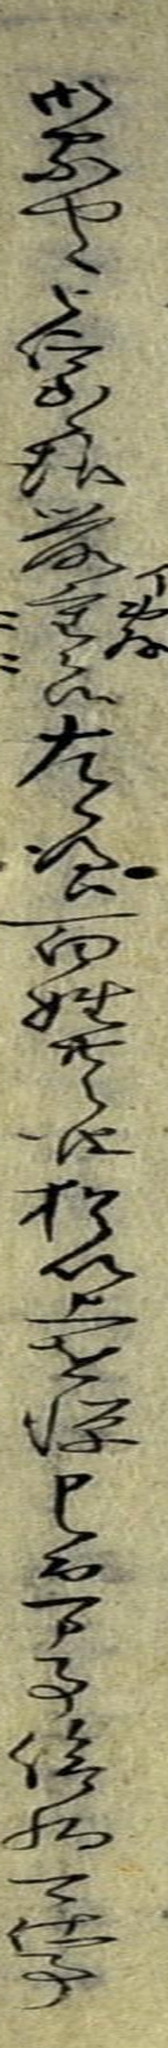御家中へ被仰出候趣厳重ニイ敷候左候得ハ百姓共之儀猶以上を憚申候而万事倹約可仕事
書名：命令之部 一
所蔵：福井県文書館 Fukui Prefectural Archives
